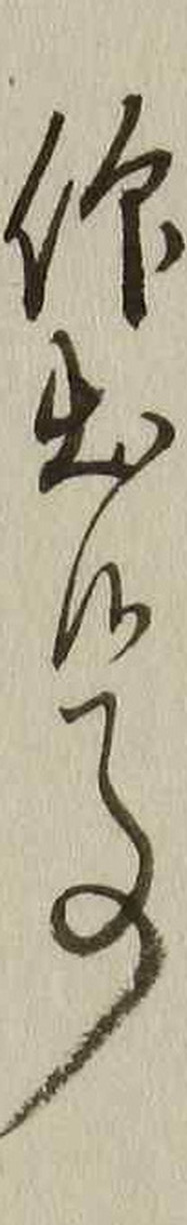仰出候事
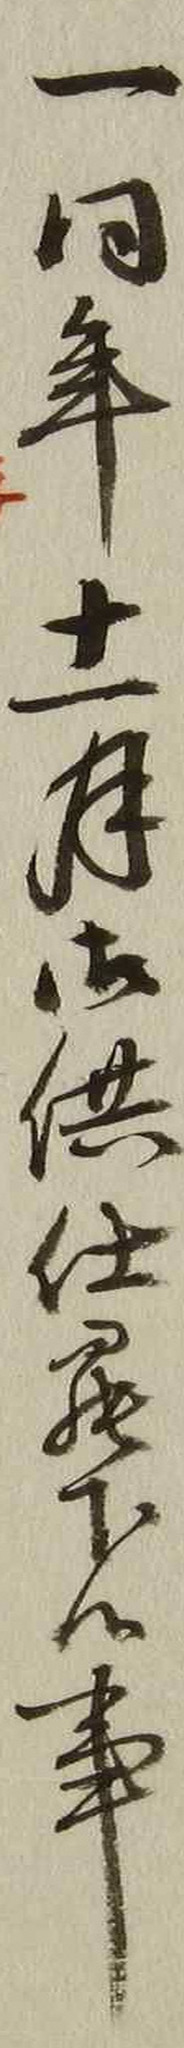一同年十一月御供仕罷下候事
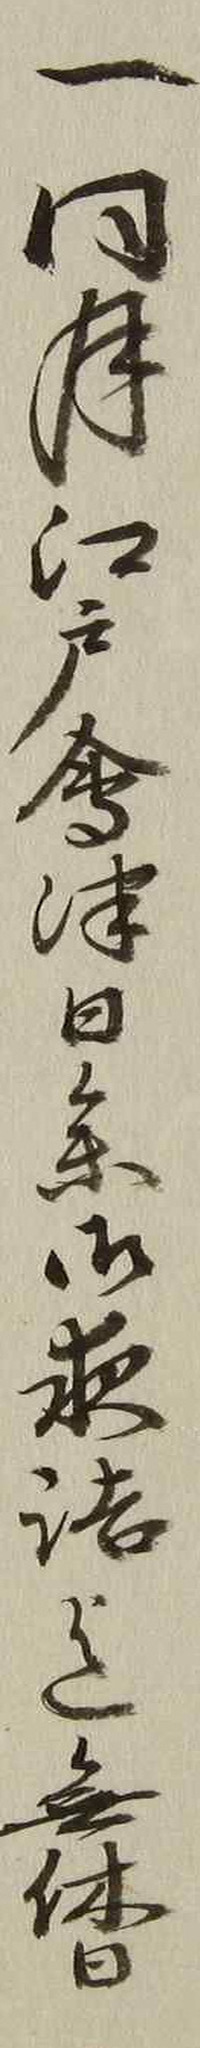一同月江戸会津日参御夜詰迄無休日
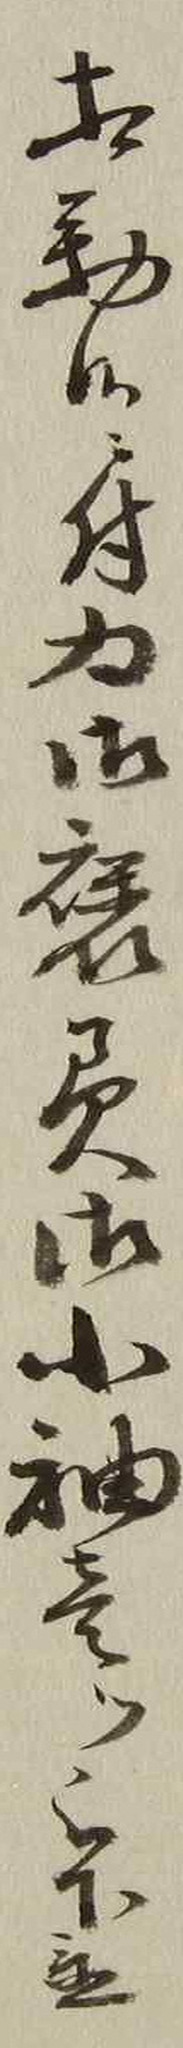相勤候ニ付為御褒美御小袖壱ツ被下置
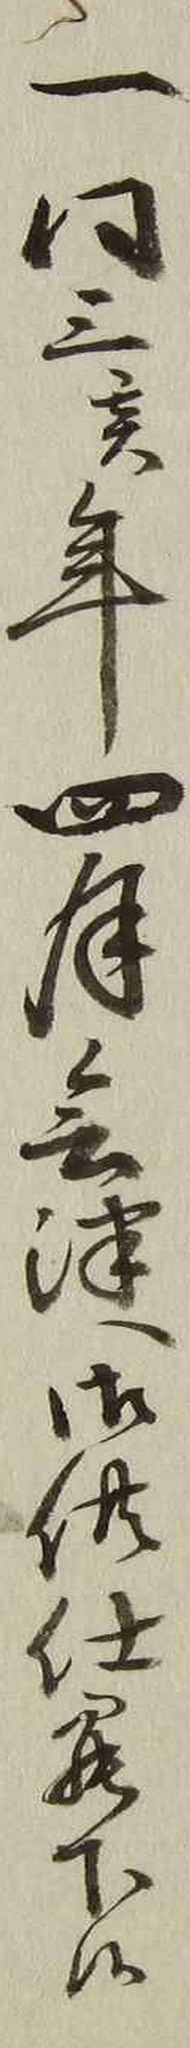一同三亥年四月会津へ御供仕罷下候
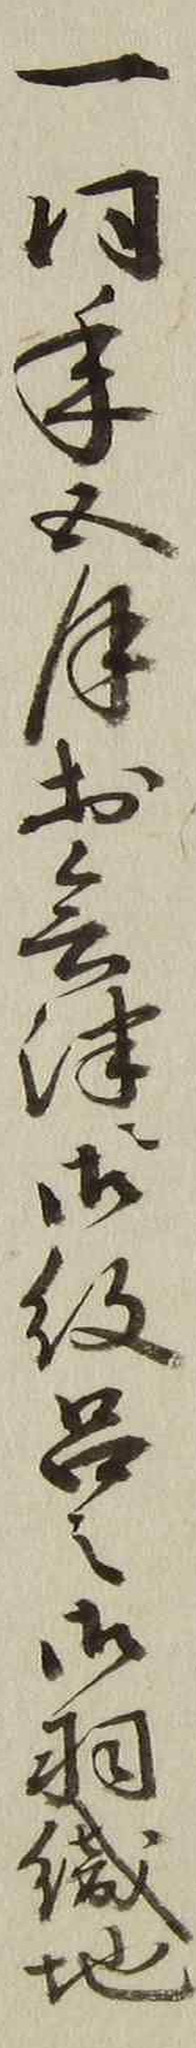一同年五月於会津ニ御紋品之御羽織地
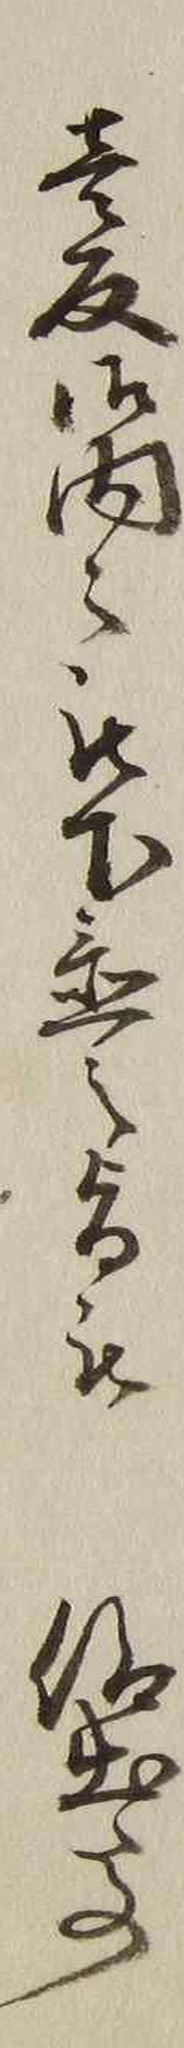壱反御内々被下置之旨被仰出候事
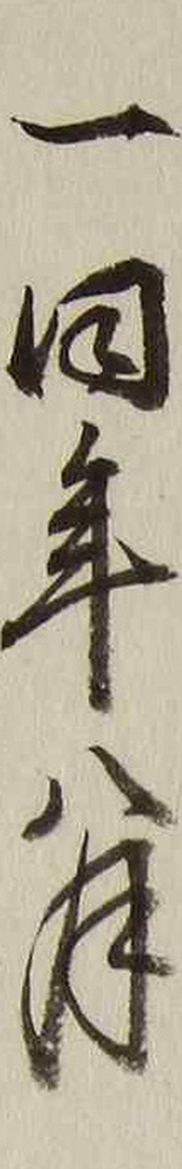一同年八月
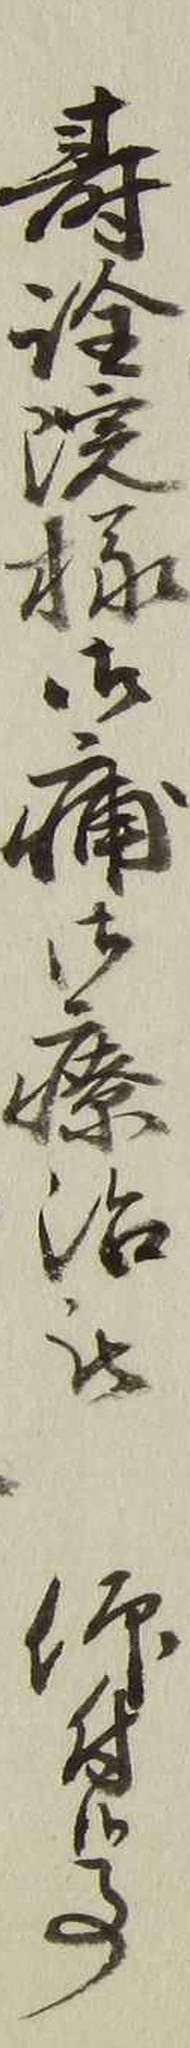壽詮院様御痛御療治被仰付候事
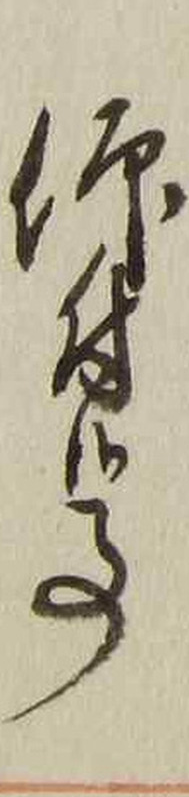仰出候事
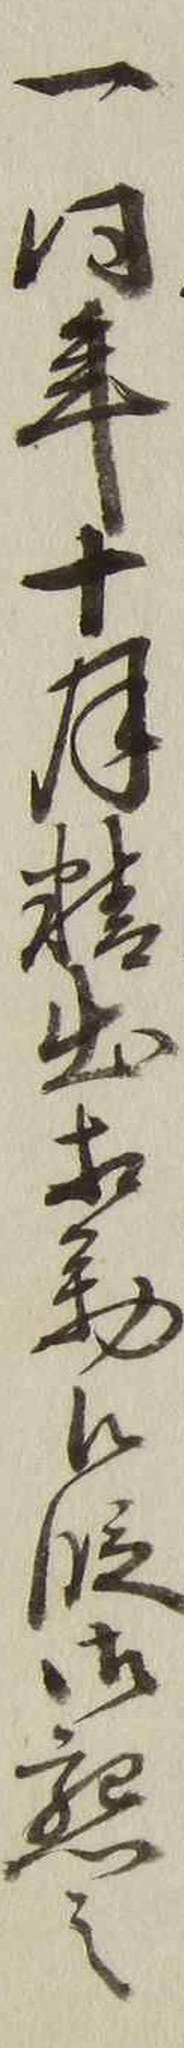一同年十月精出相勤候段御懇之

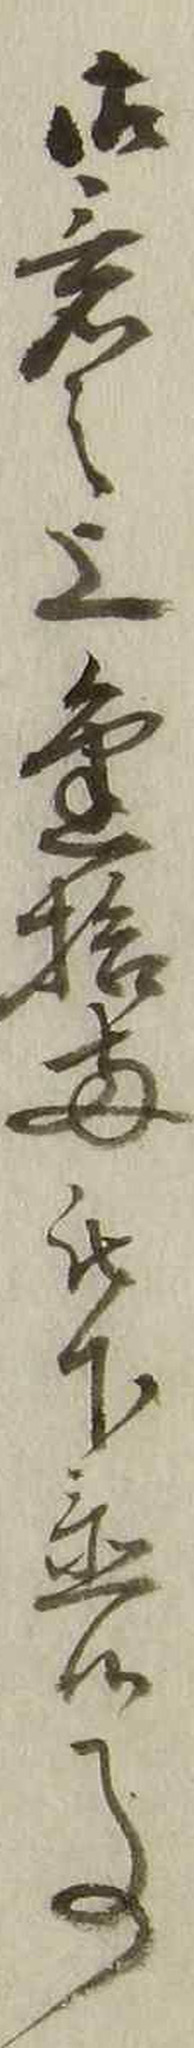御意之上金拾両被下置候事
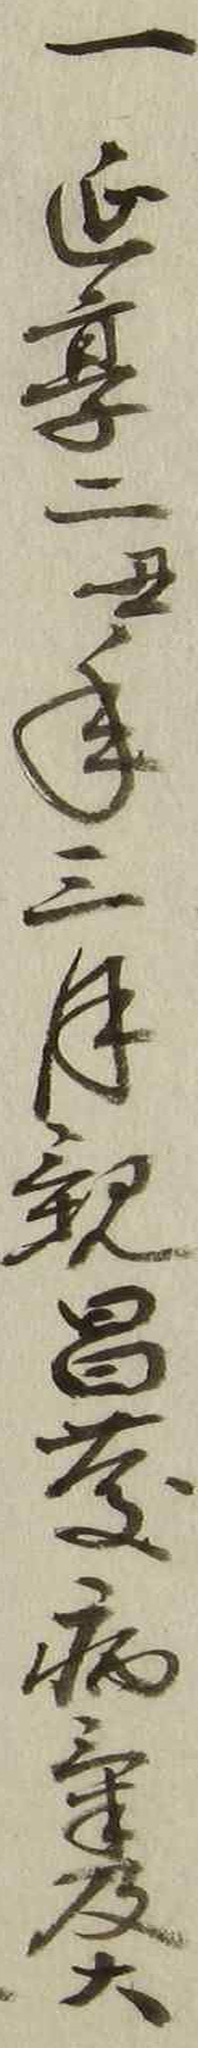一延享二丑年三月親昌慶病気及大
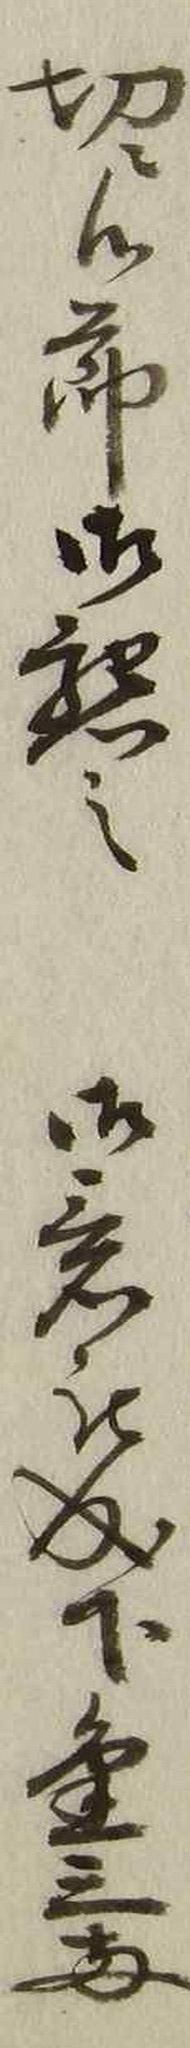切ニ候節御懇之御意被成下金三両
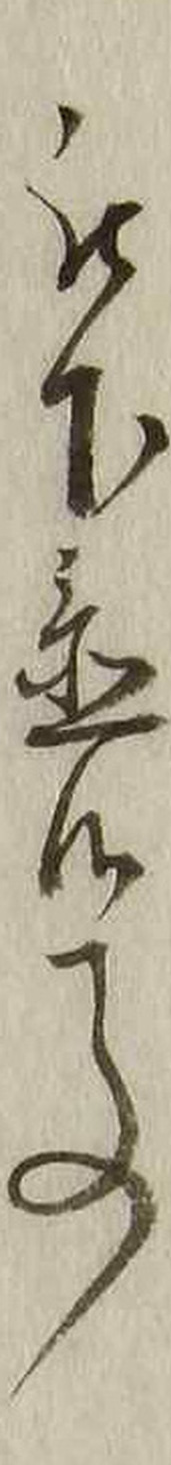被下置候事
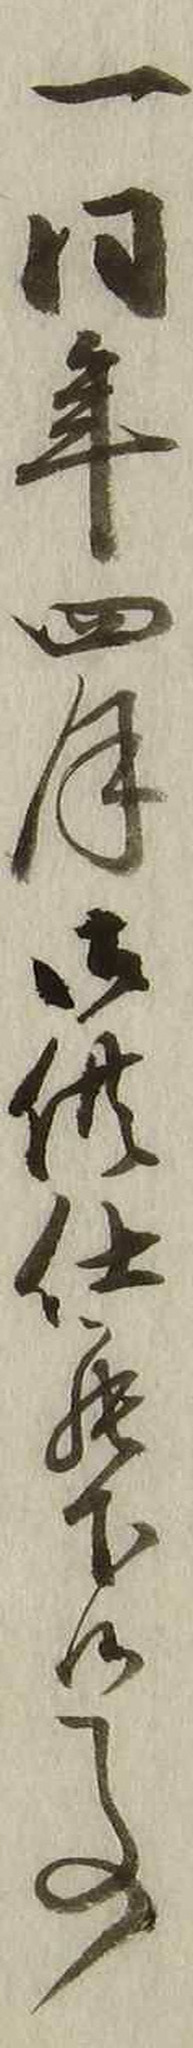一同年四月御供仕罷下候事
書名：諸士系譜　巻之31　い之部31
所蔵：会津若松市立会津図書館
